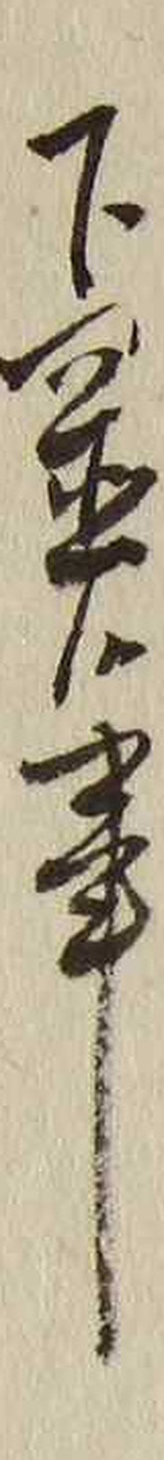下置候事
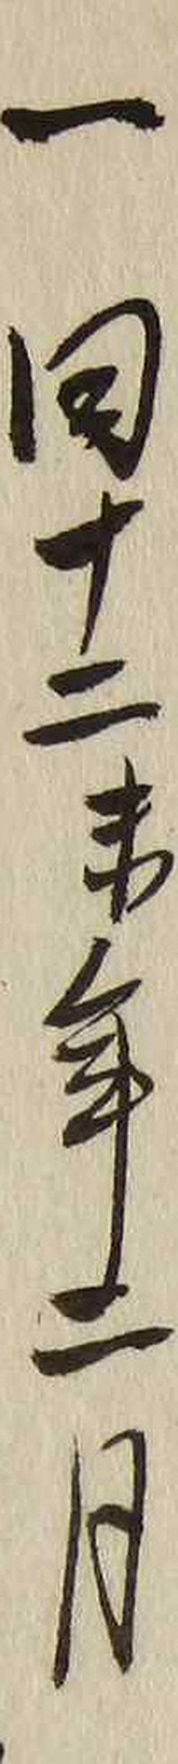一同十二未年二月
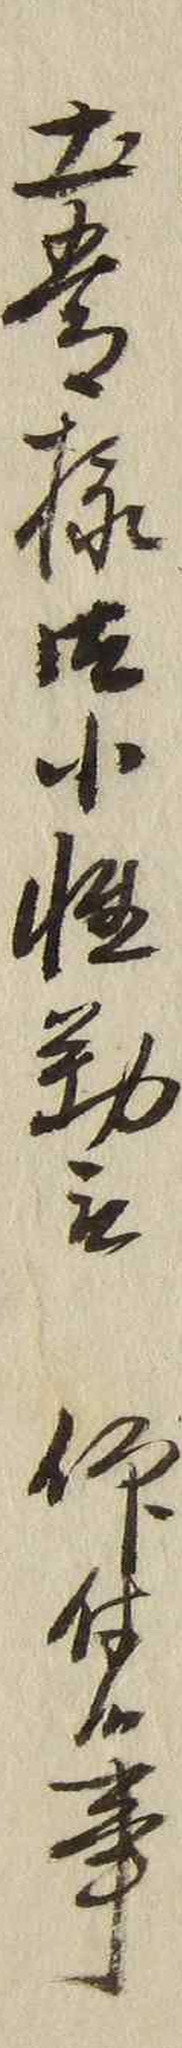土常様御小性勤被仰付候事

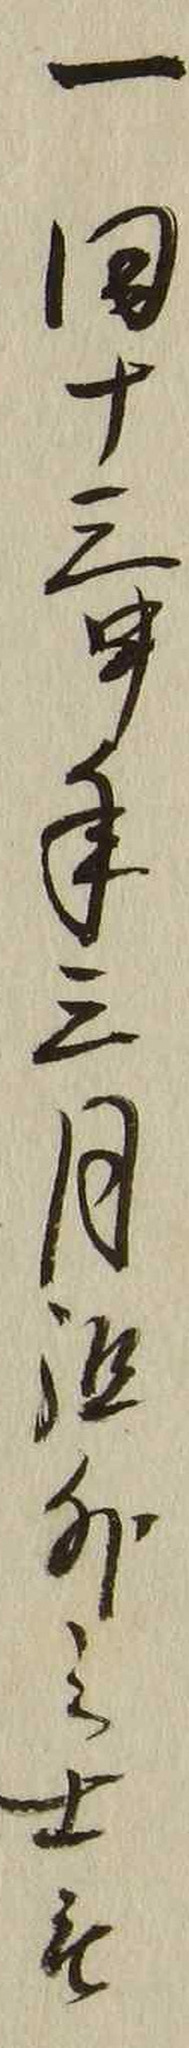一同十三申年三月組外之士被
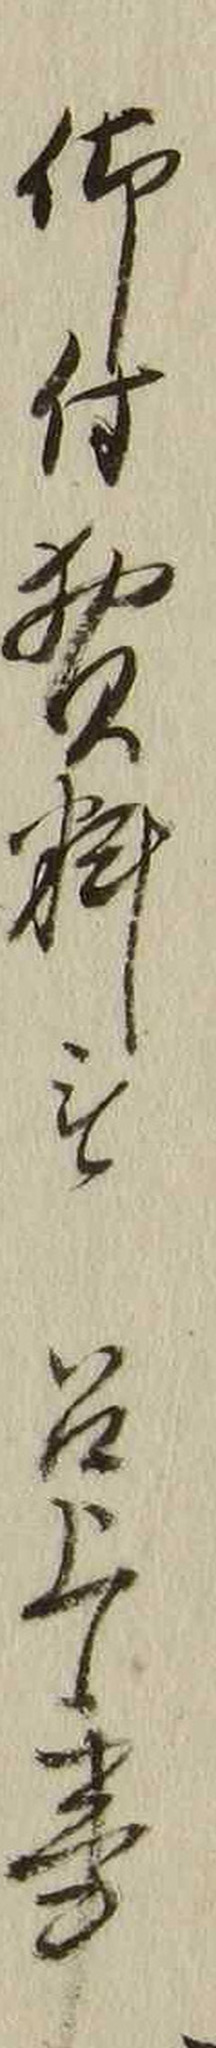仰付費料被召上候事
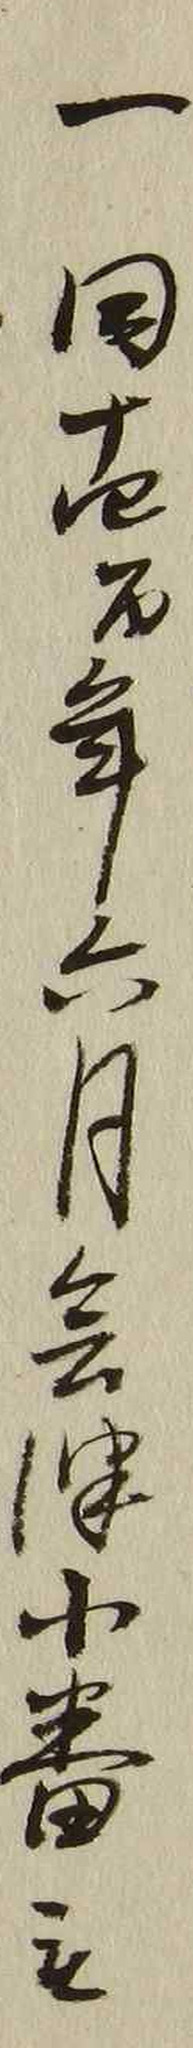一同十四酉年六月会津小番被
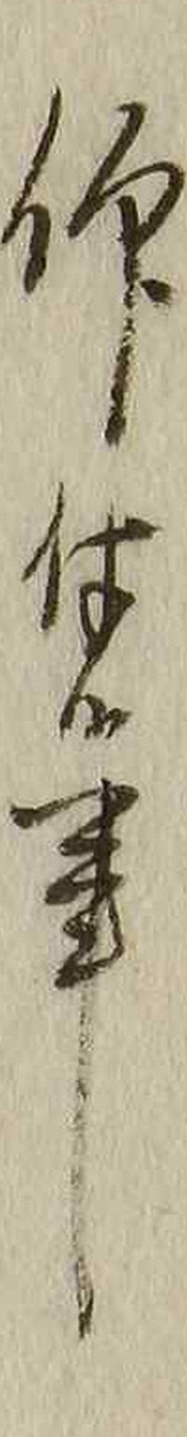仰付候事
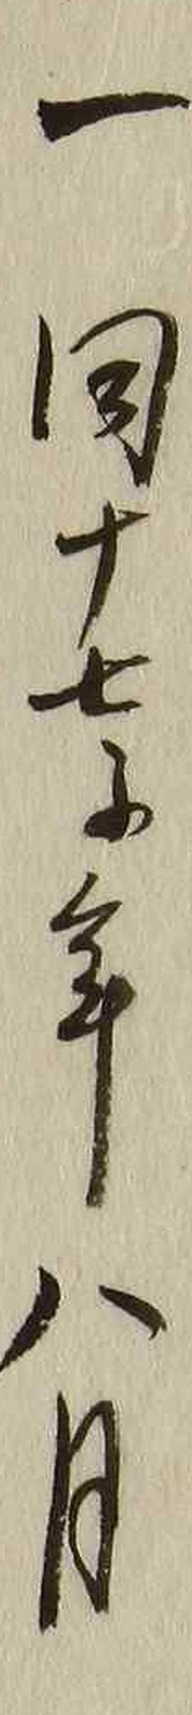一同十七子年八月
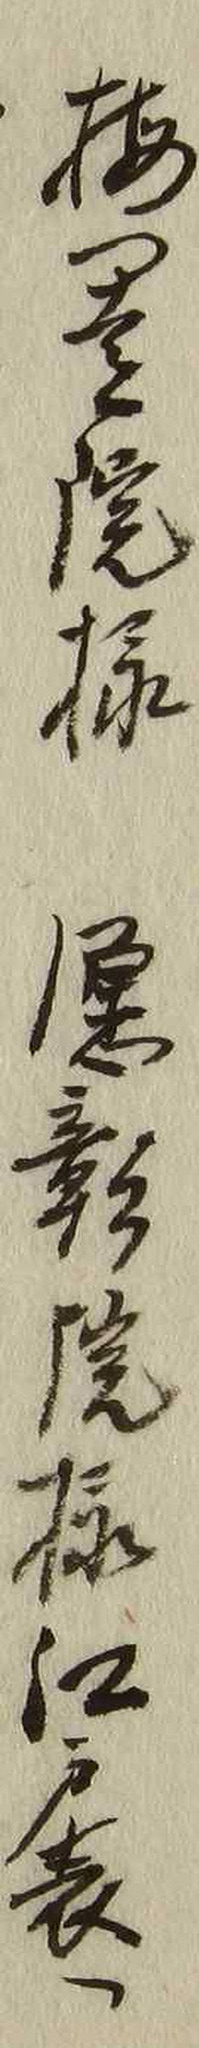梅園院様愿彰院様江戸表へ
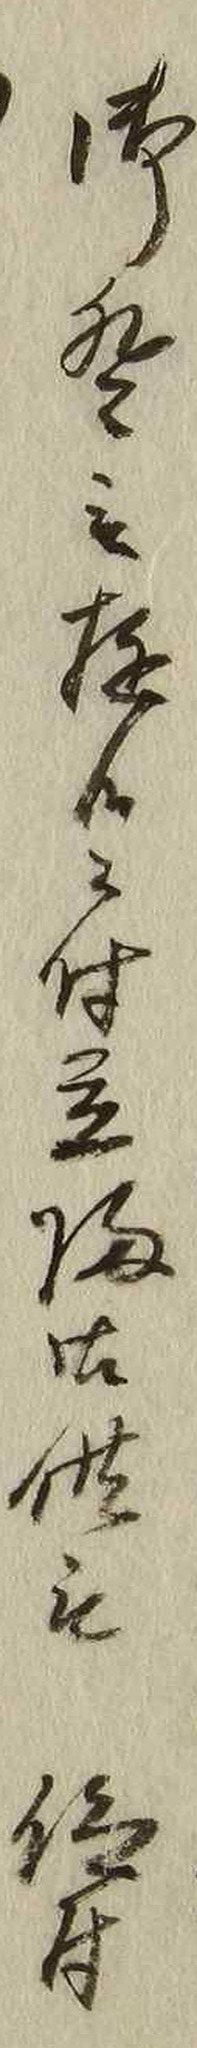御登被遊候ニ付立帰御供被仰付
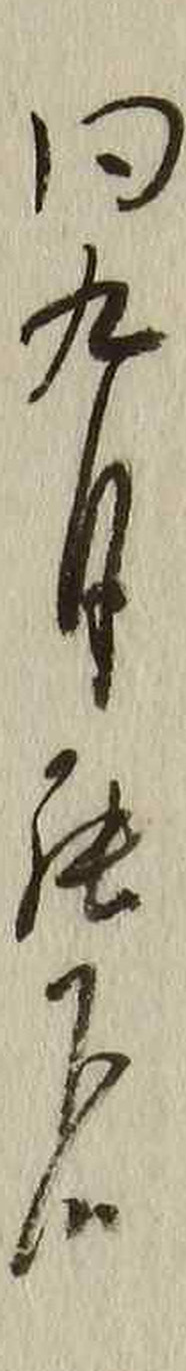同九月罷下候
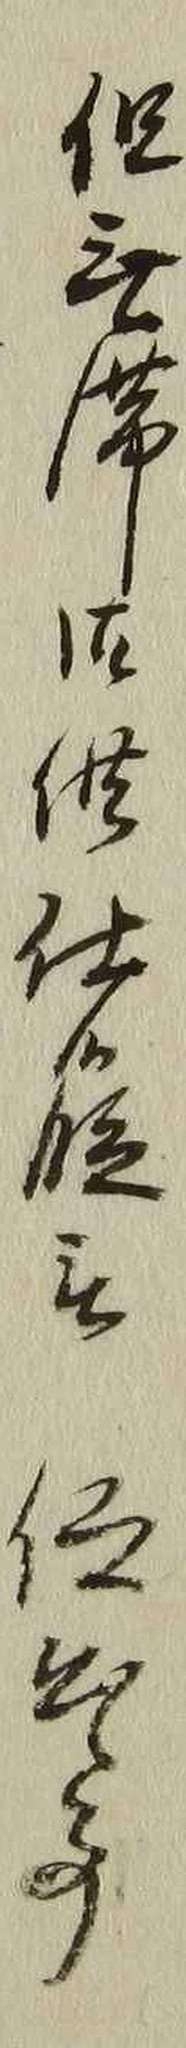但無滞御供仕候段被仰出候事
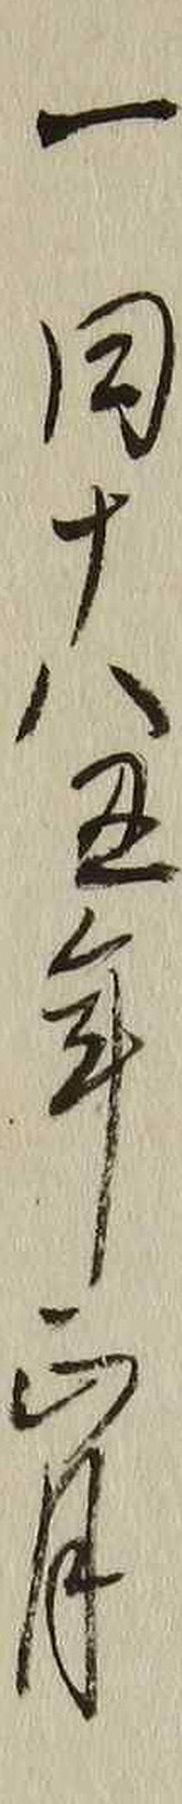一同十八丑年正月
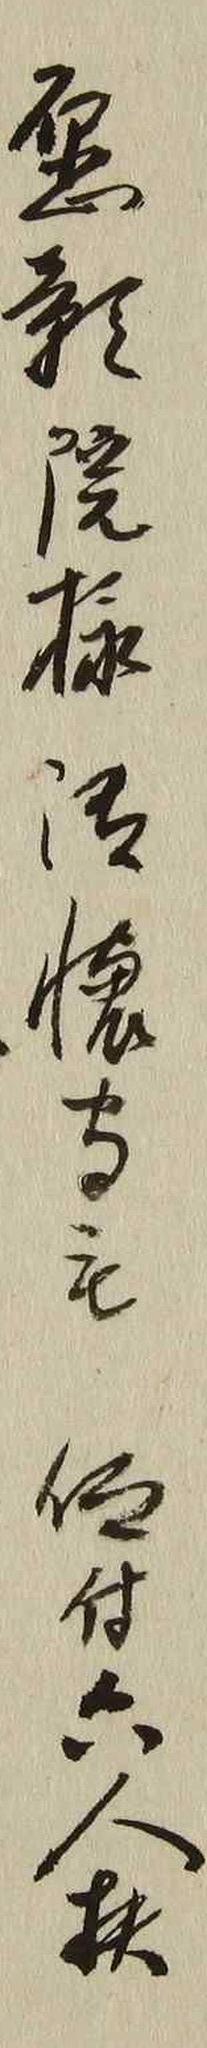愿彰院様御懐守被仰付六人扶
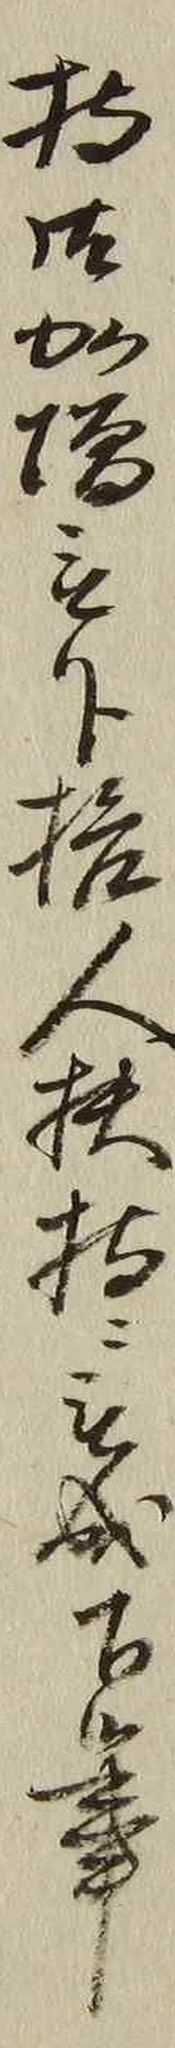持御加増被下拾人扶持ニ被成下候事
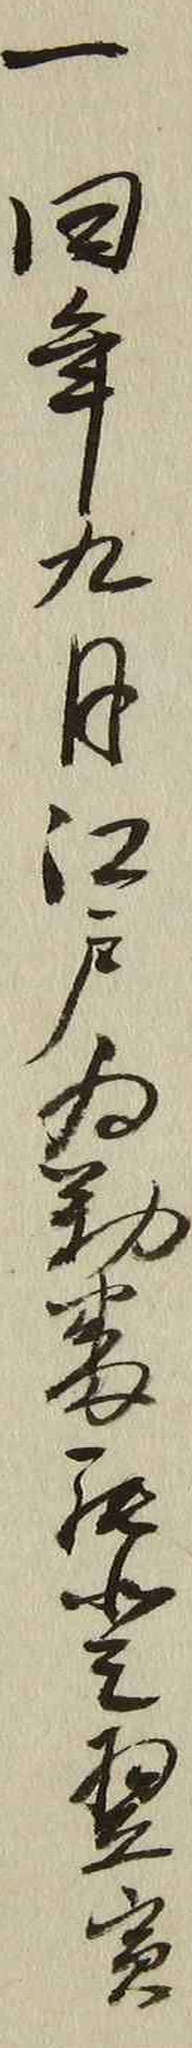一同年九月江戸為勤番罷登翌寅
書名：諸士系譜　巻之349　も之部5
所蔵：会津若松市立会津図書館
